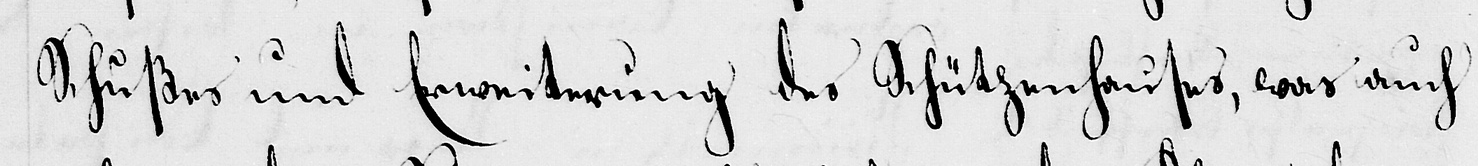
Schußes und Erweiterung des Schützenhauses, was auch
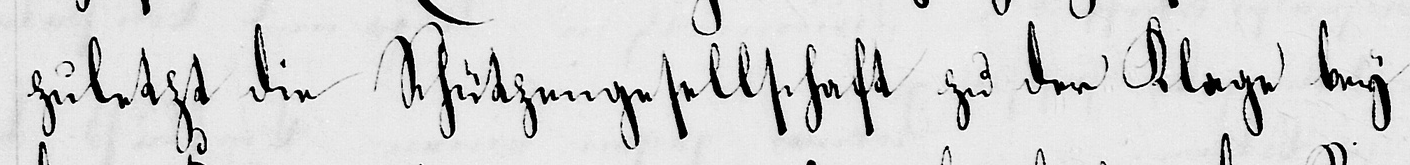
zuletzt die Schützengesellschaft zu der Klage bey
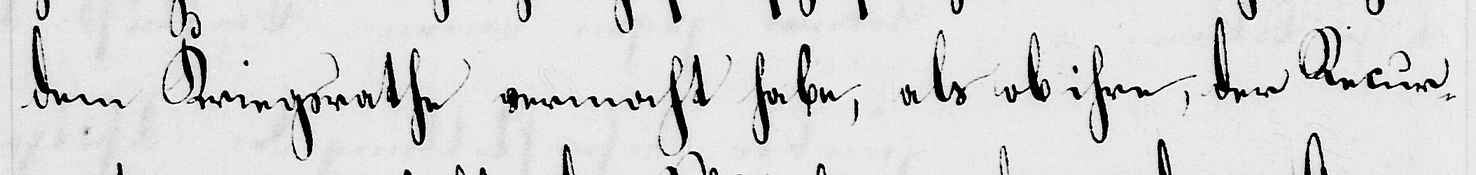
dem Kriegsrathe vermacht habe, als ob ihre, der Recur¬
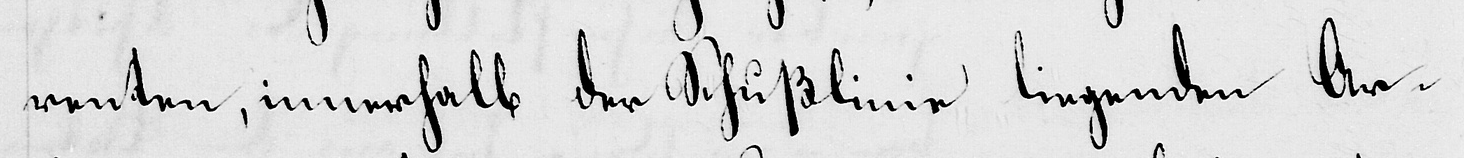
renten, innerhalb der Schußlinie liegenden Ar¬
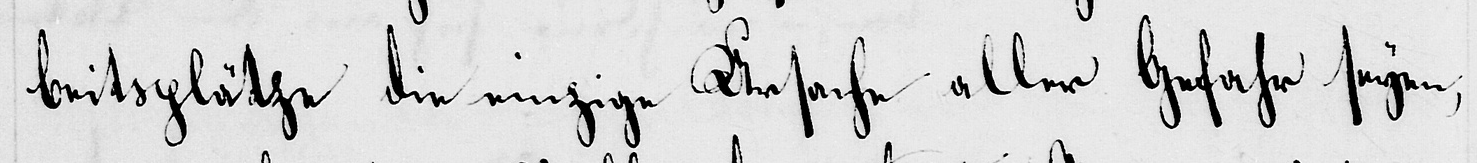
beitsplätze die einzige Ursache aller Gefahr seyen,
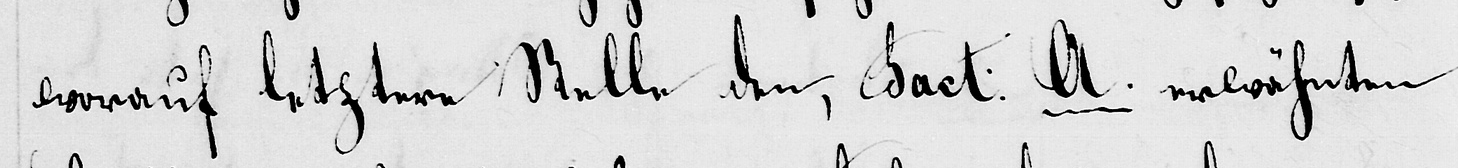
worauf letztere Stelle den, Fact: A. erwähnten
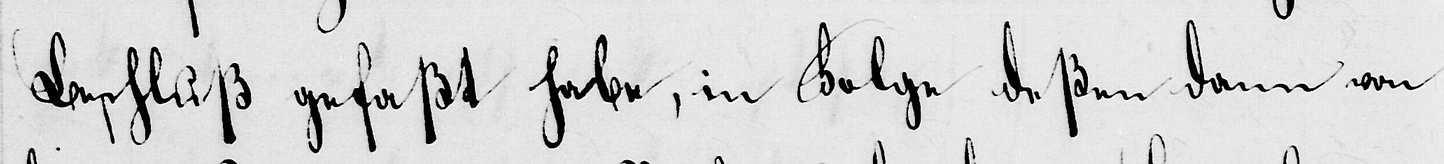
Beschluß gefaßt habe, in Folge deßen dann von
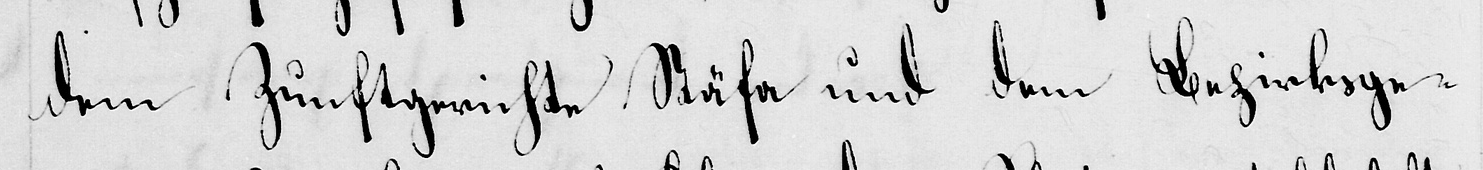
dem Zunftgerichte Stäfa und dem Bezirksge¬
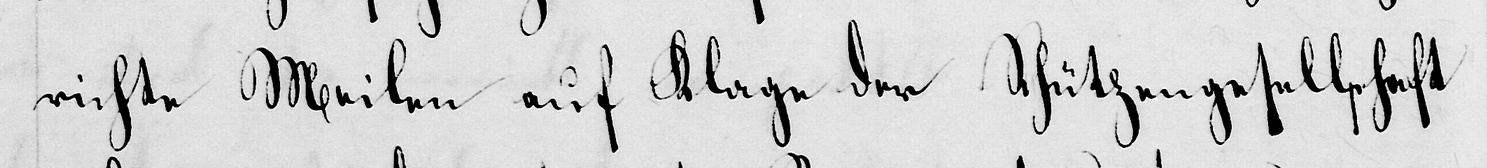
richte Meilen auf Klage der Schützengesellschaft
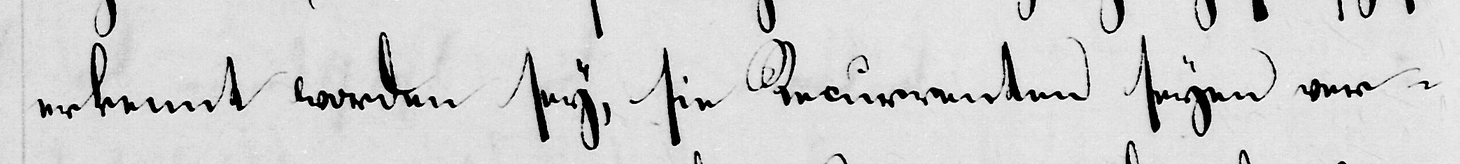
erkennt worden sey, sie Recurrenten seyen ver¬
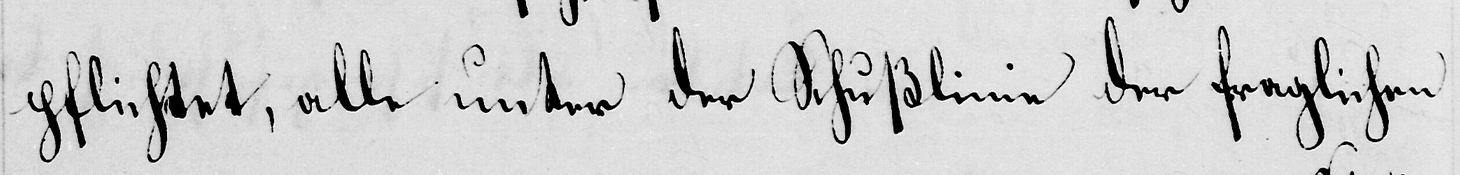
pflichtet, alle unter der Schußlinie der fraglichen
